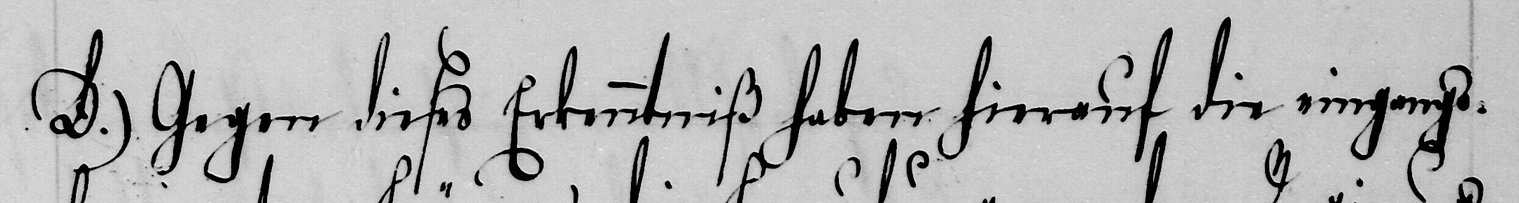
D.) Gegen dieses Erkenntniß haben hierauf die eingangs
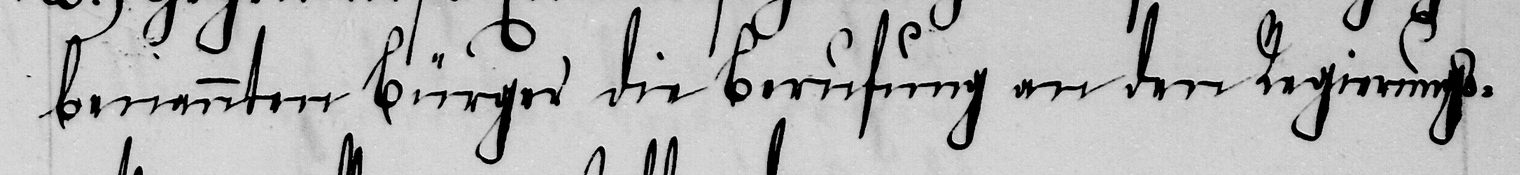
benannten Bürger die Berufung an den Regierungs¬
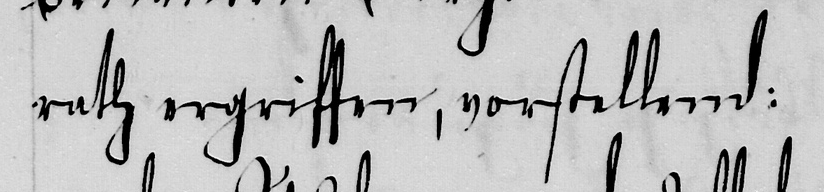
rath ergriffen, vorstellend:
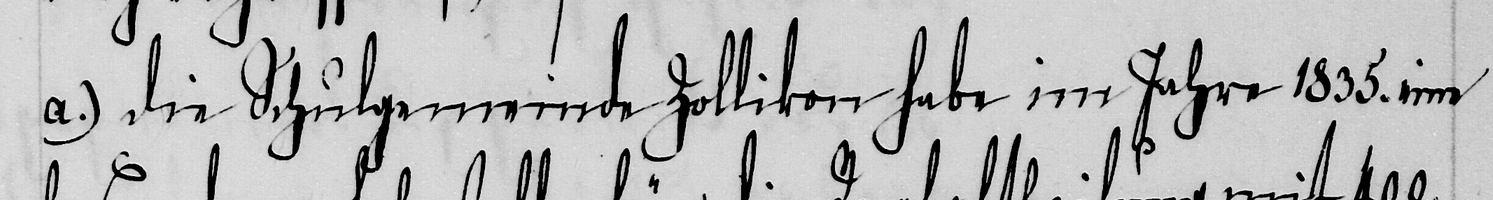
a.) die Schulgemeinde Zollikon habe im Jahre 1835. eine
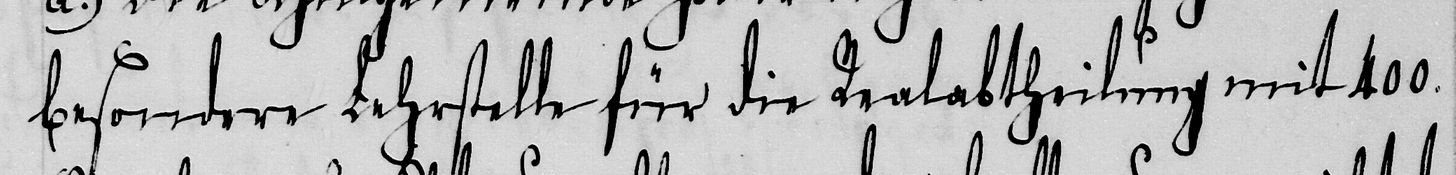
besondere Lehrstelle für die Realabtheilung mit 400.
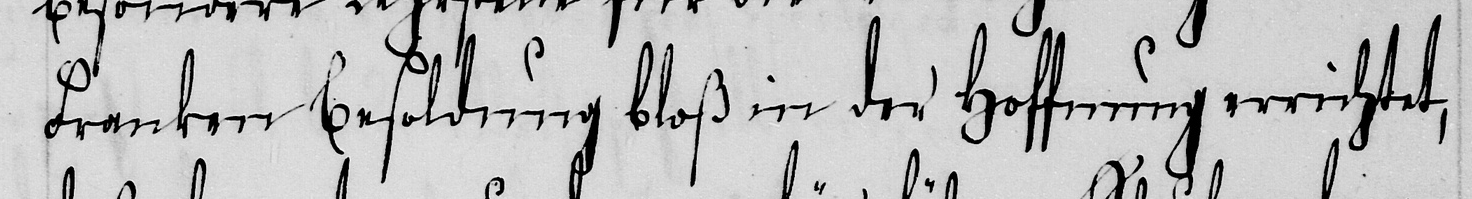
Franken Besoldung bloß in der Hoffnung errichtet,
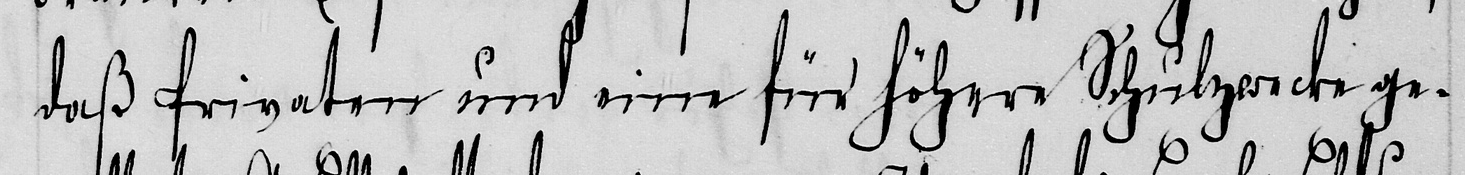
daß Privaten und eine für höhere Schulzwecke ge¬
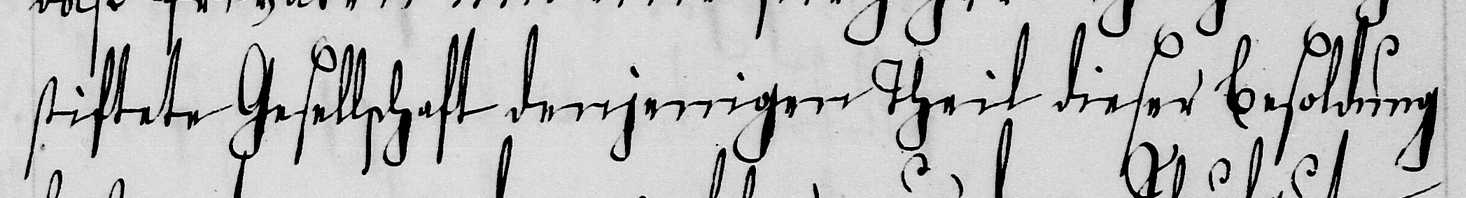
iftete Gesellschaft denjenigen Theil dieser Besoldung
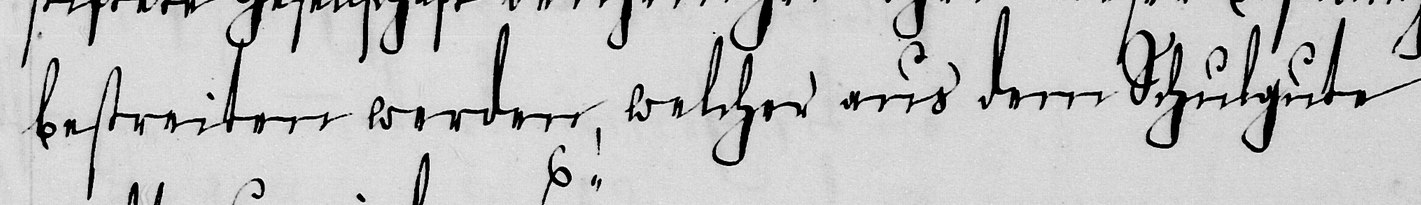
bestreiten werden, welcher aus dem Schulgute
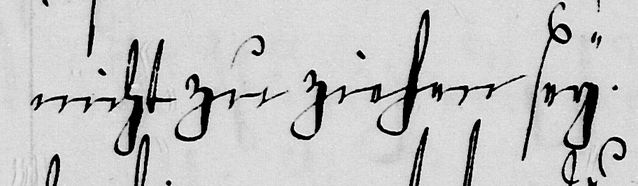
nicht zu ziehen sey.
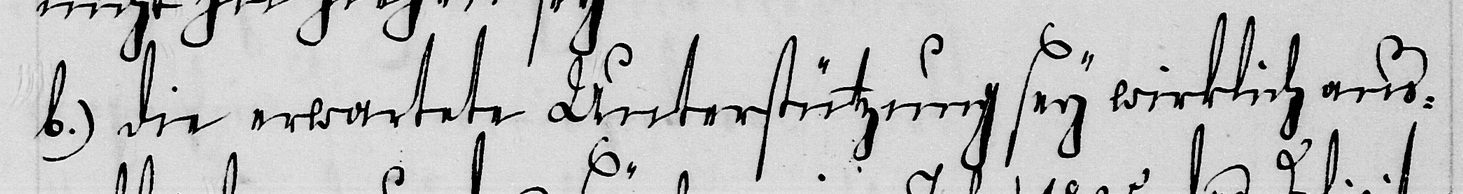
b.) die erwartete Unterstützung sey wirklich aus¬
